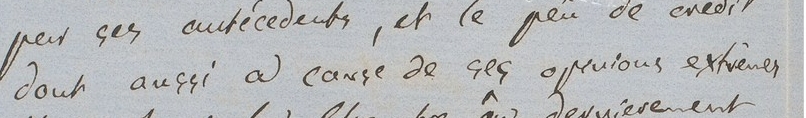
dont aussi a cause de ses opinions extrêmes
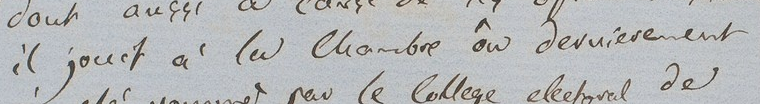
il jouit à la Chambre ôu dernierement
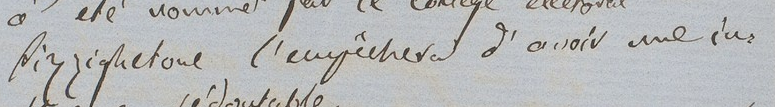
Pizzighetone l'empêchera d'avoir une in-
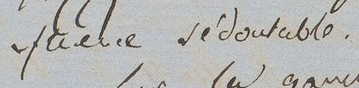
fluence rédoutable.
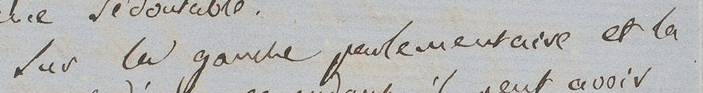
Sur la gauche parlementaire et la
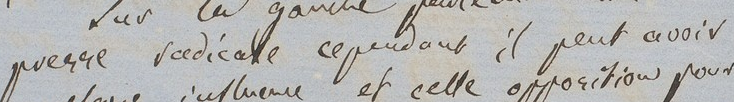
presse radicale cependant il peut avoir
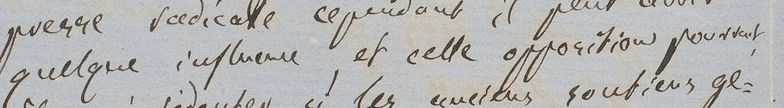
quelque influence et cette opposition pourrait
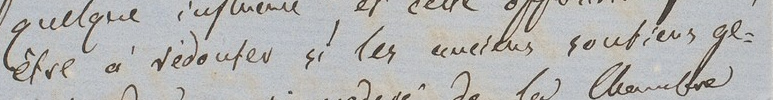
être à rédouter si les anciens soutiens gé-
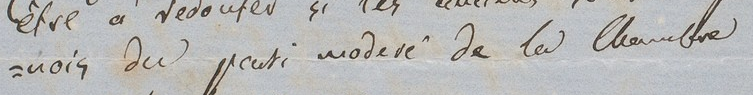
nois du parti moderé de la Chambre
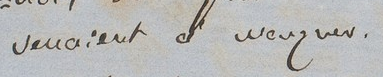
seraient à manquer.
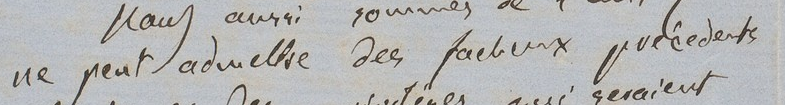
ne peut admettre des facheux précedents
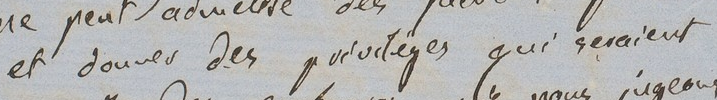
et donner des privilèges qui seraient
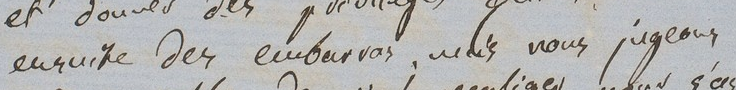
ensuite des embarras, mais nous jugeons
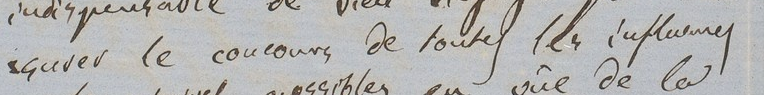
surer le concours de toutes les influences
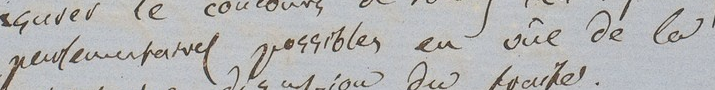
parlementaires possibles en vûe de la
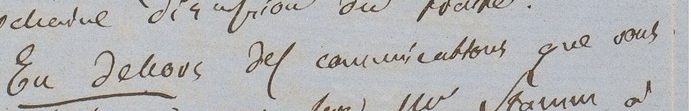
En dehors des comminations que vous
